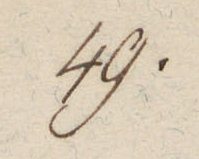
49.
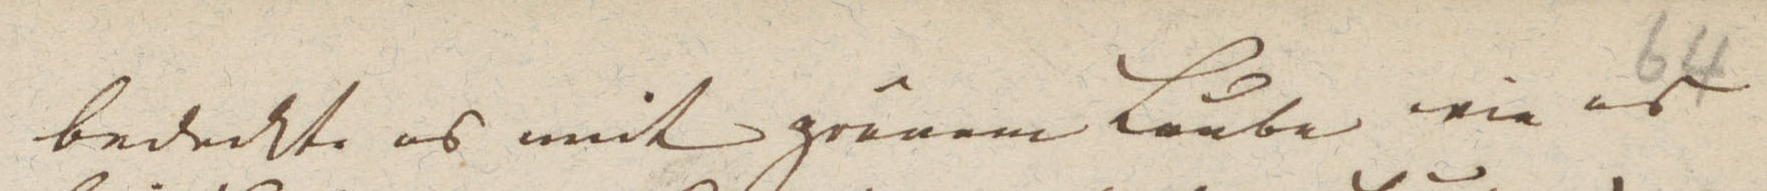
bedeckte es mit grünem Laube wie es
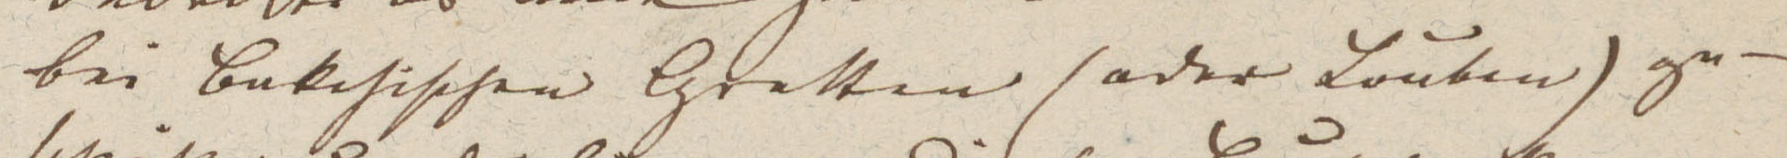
bei Bakisischen Grotten (oder Lauben) ge-
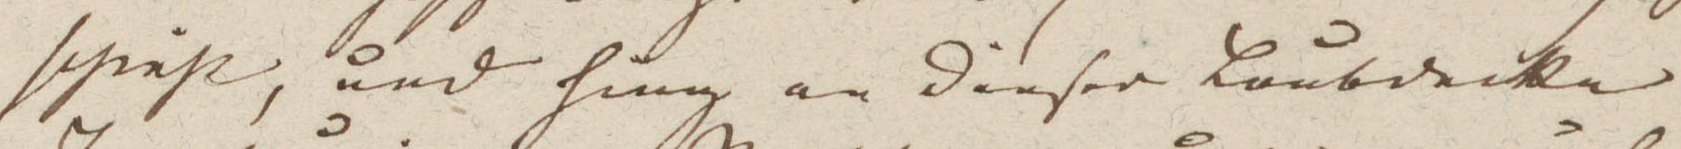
schieht, und hing an dieser Laubdecke
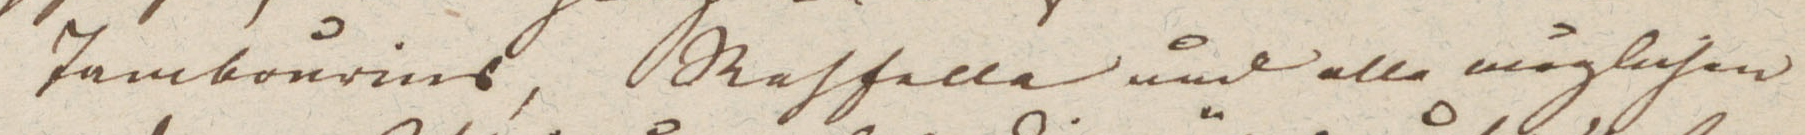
Tambourins, Rehfelle und alle möglichen
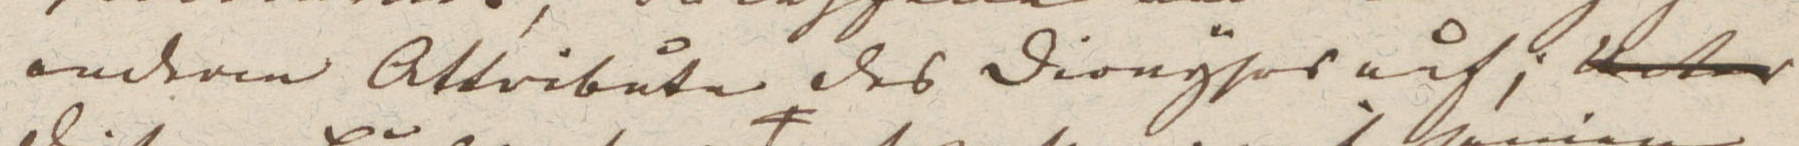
anderen Attribute des Dionysos auf; Unter
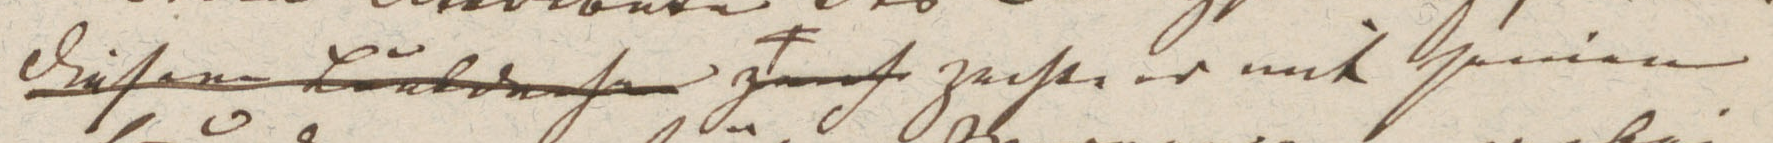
diesem Laubdache % zechte er mit seinen
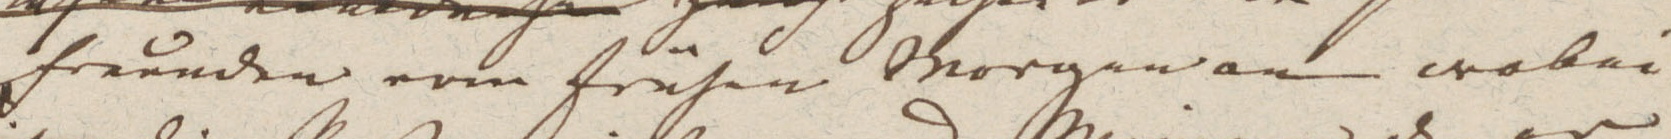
Freunden vom frühen Morgen an wobei
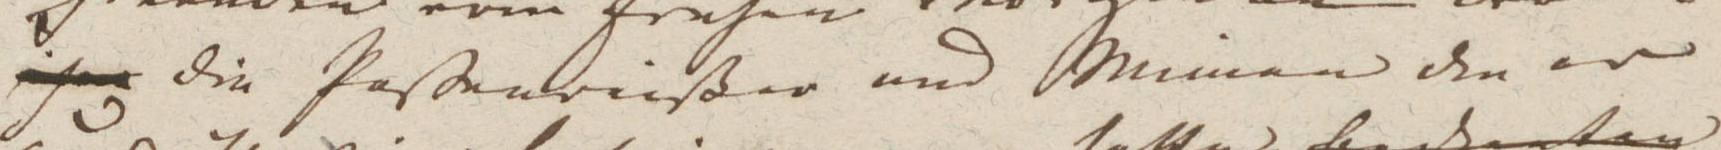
ihm die Possenreisser und Mimen die er
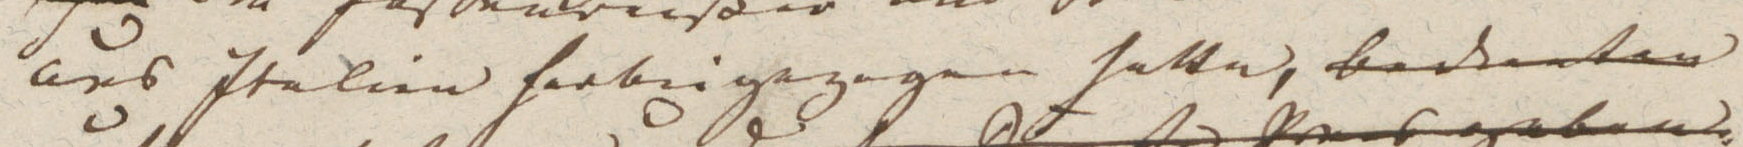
aus Italien herbeigezogen hatte bedeuten
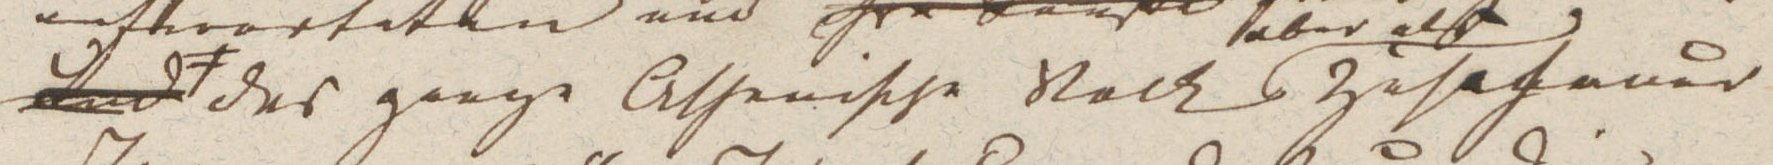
und % das ganze Athenische Volk aber als Zuschauer
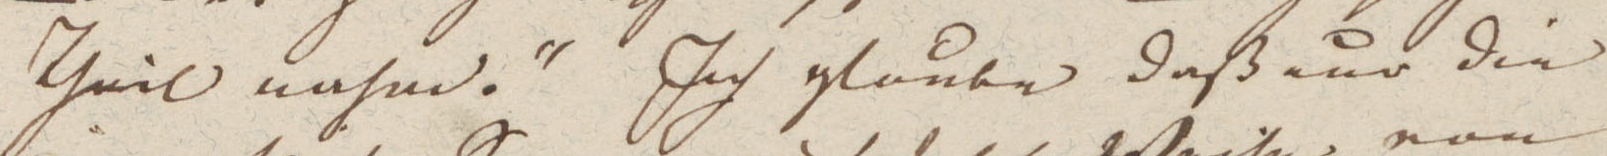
Theil nahm." Ich glaube dass nur die
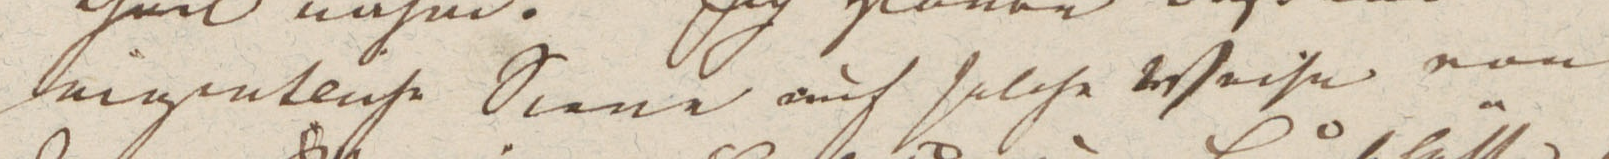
eigentliche Scene auf solche Weise von
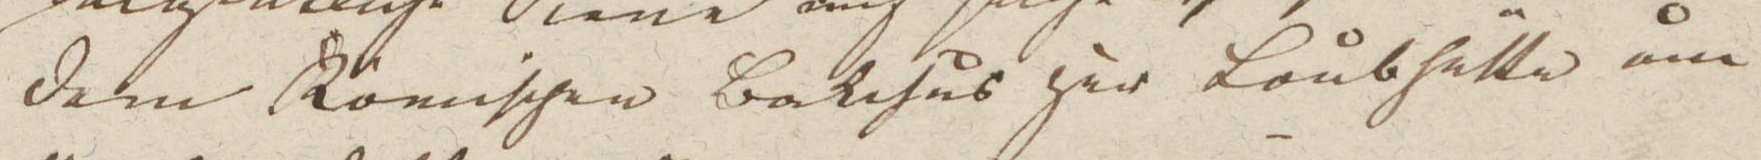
dem Römischen Bakchus zur Laubhütte um-
